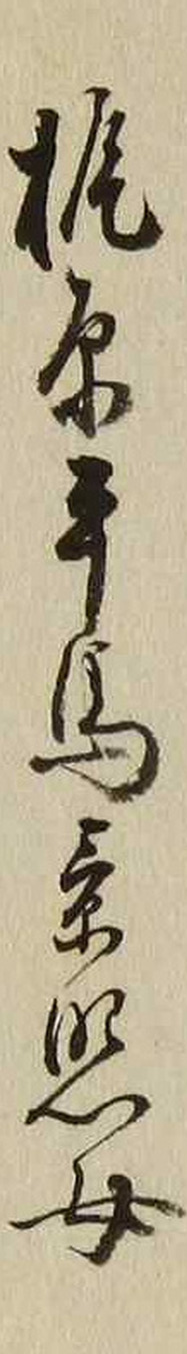梶原平馬景照女
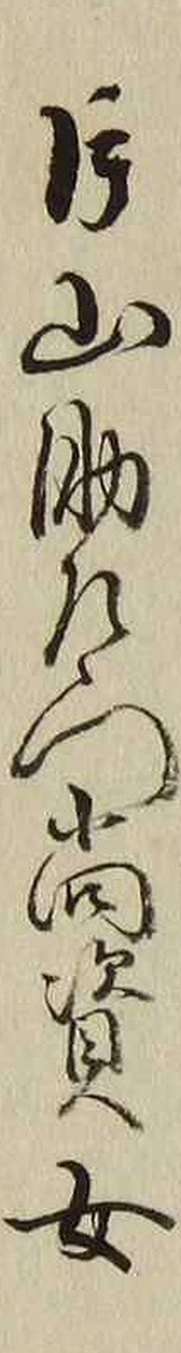片山助左衛門尚資女
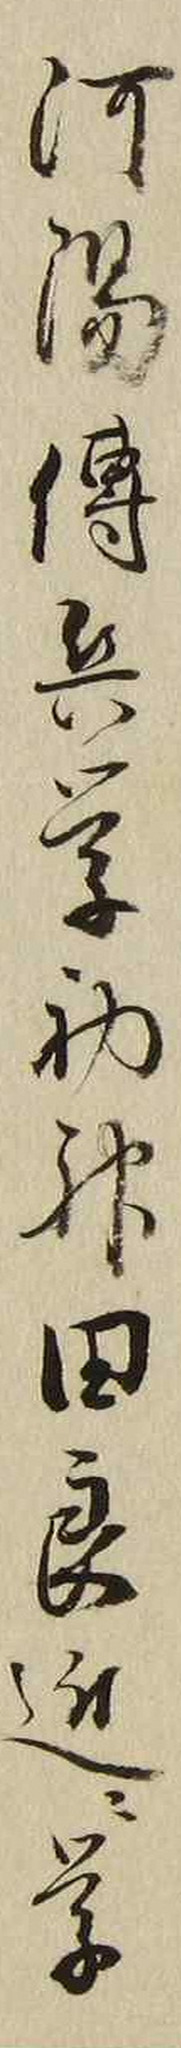河陽傳兵学初神田良近ニ学
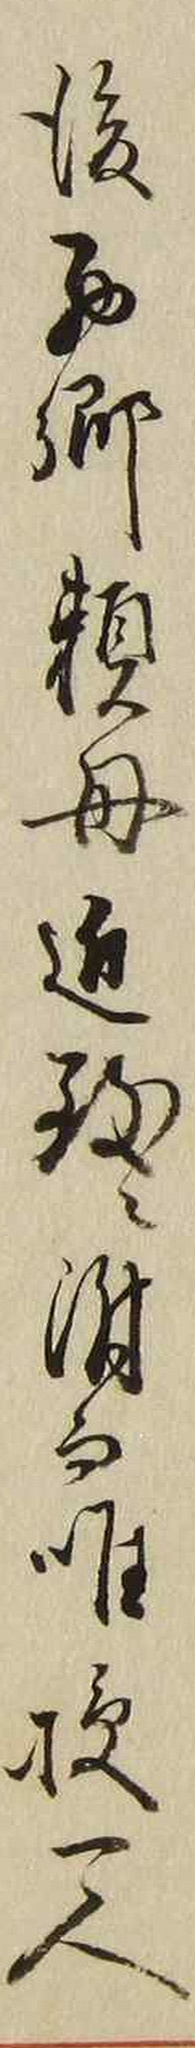後西郷頼母近致ニ付而唯授一人

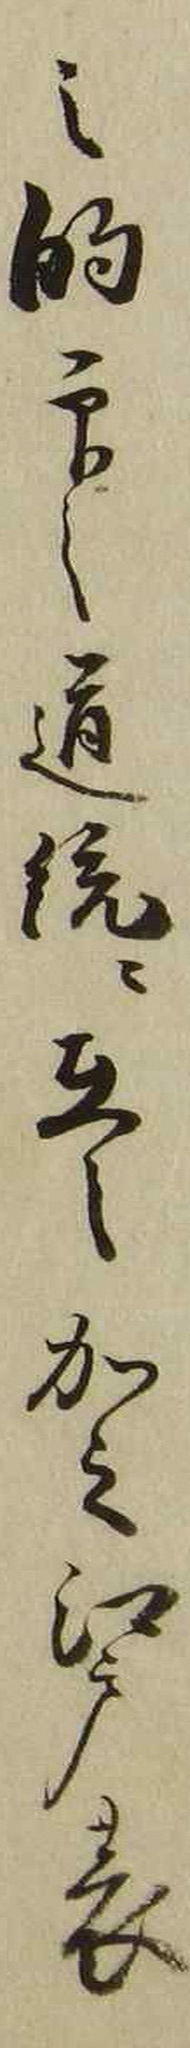之的印之道統ニ在之加之江戸表
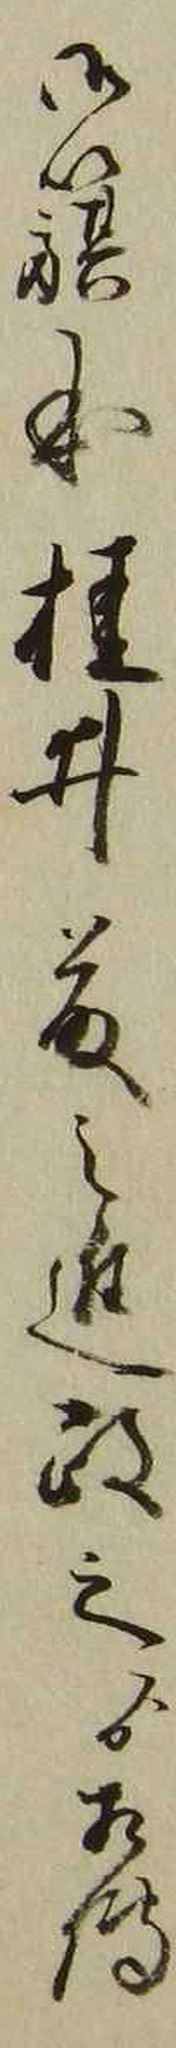御籏旗本桂井藤之進政之ゟ相伝
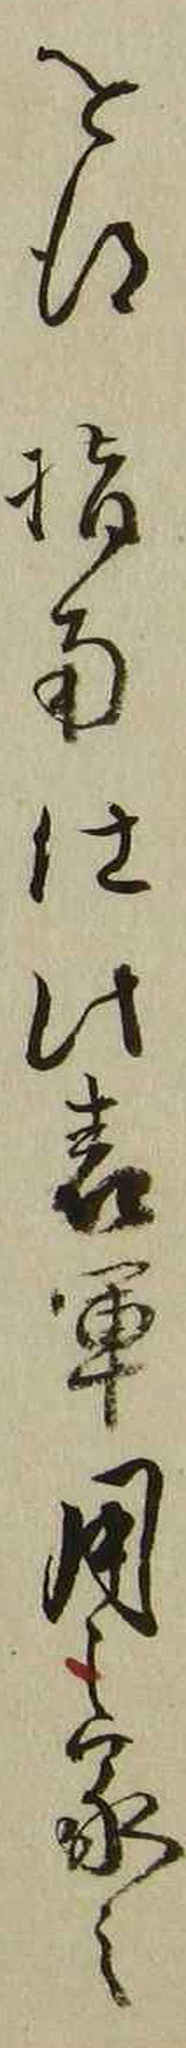を得指南仕此表軍用之家之
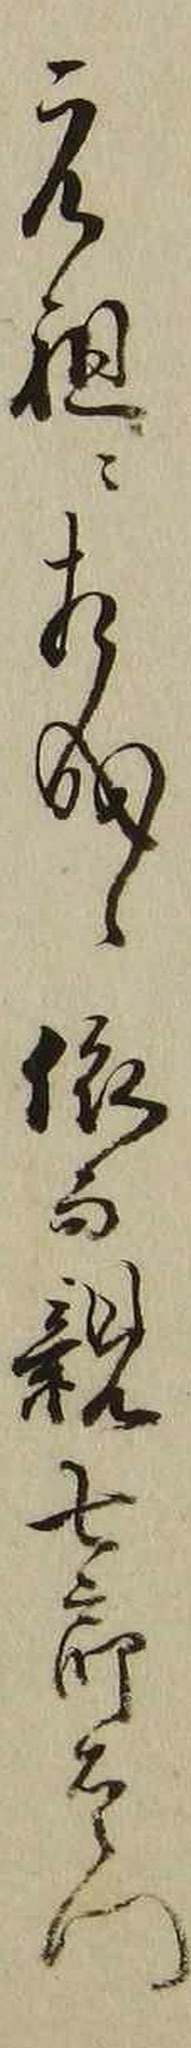元祖ニ相成候依而親七郎右衛門
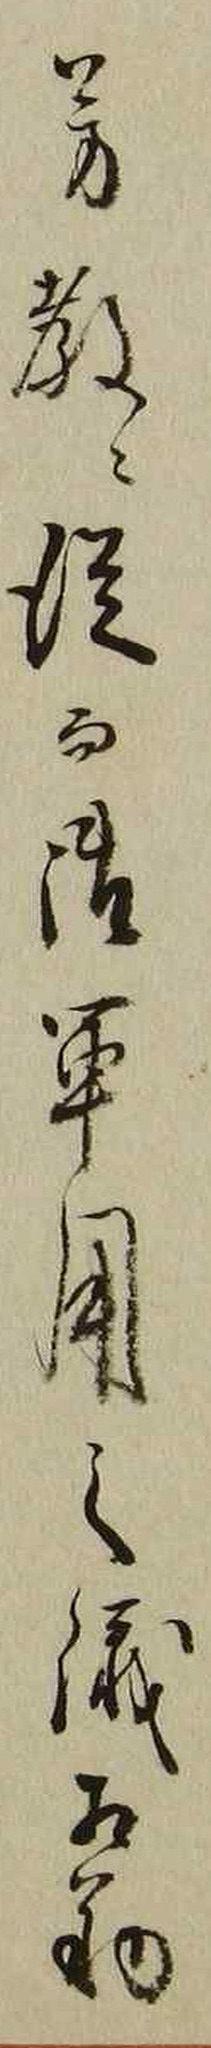芳教ニ従而御軍用之儀相勤
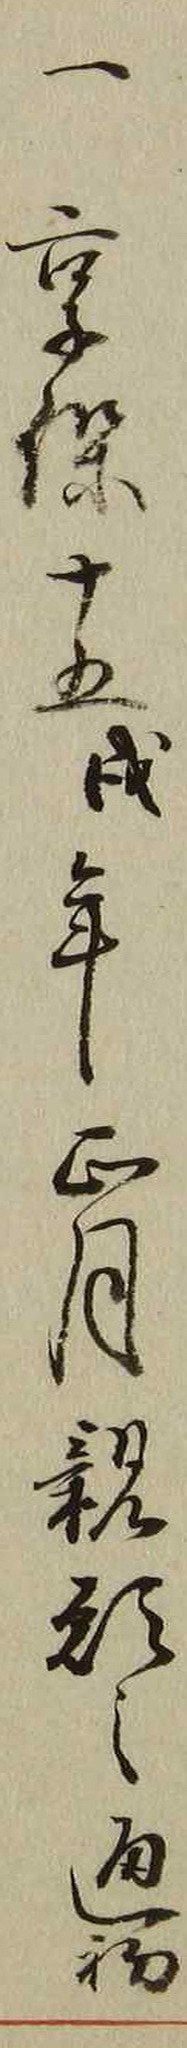一享保十五戊年正月親願之通初
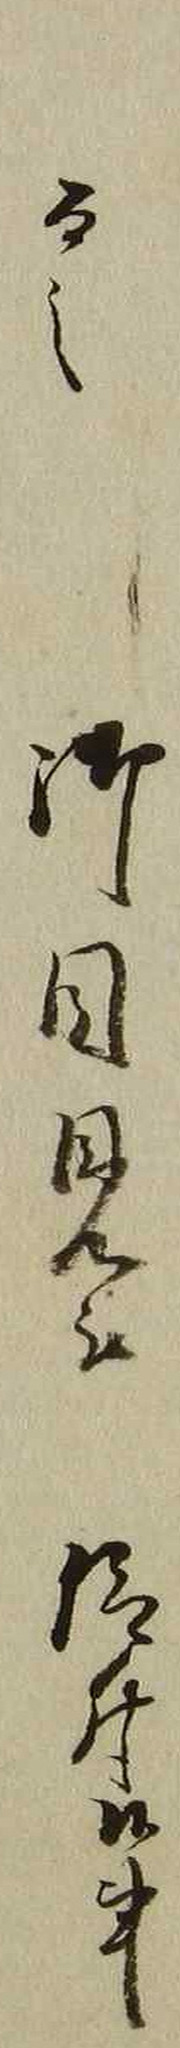而之御目見被仰付候事
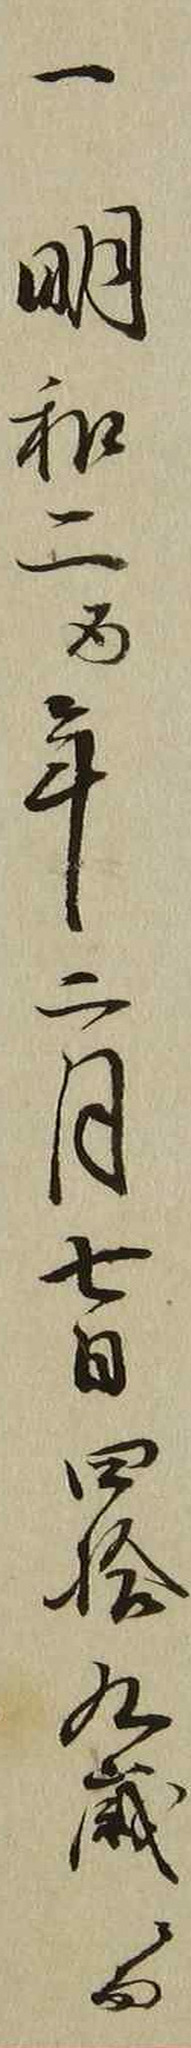一明和二酉年二月七日四拾九歳ニ而
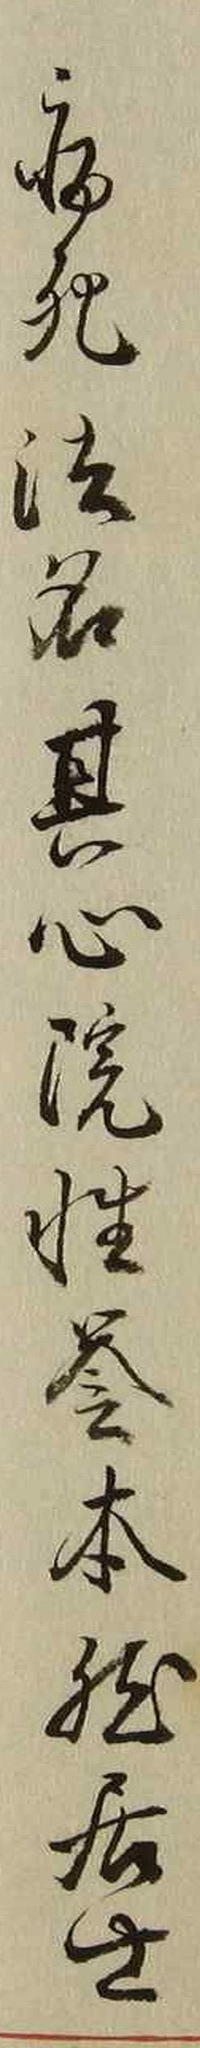病死法名其心院性誉本然居士
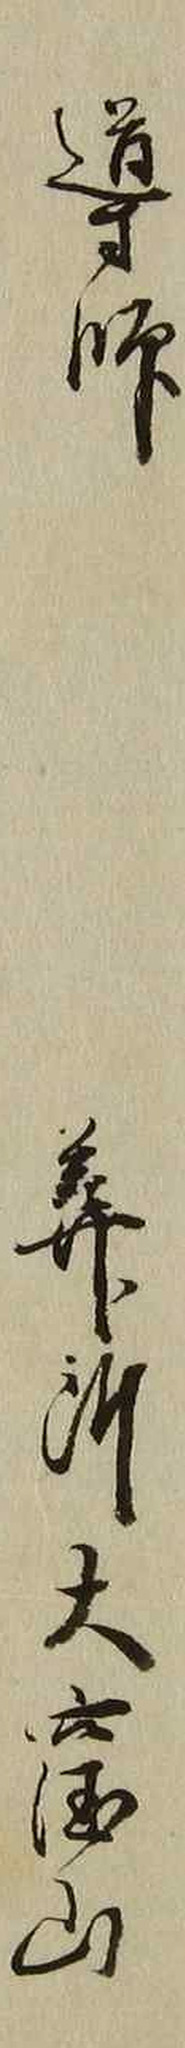導師葬所大窪山
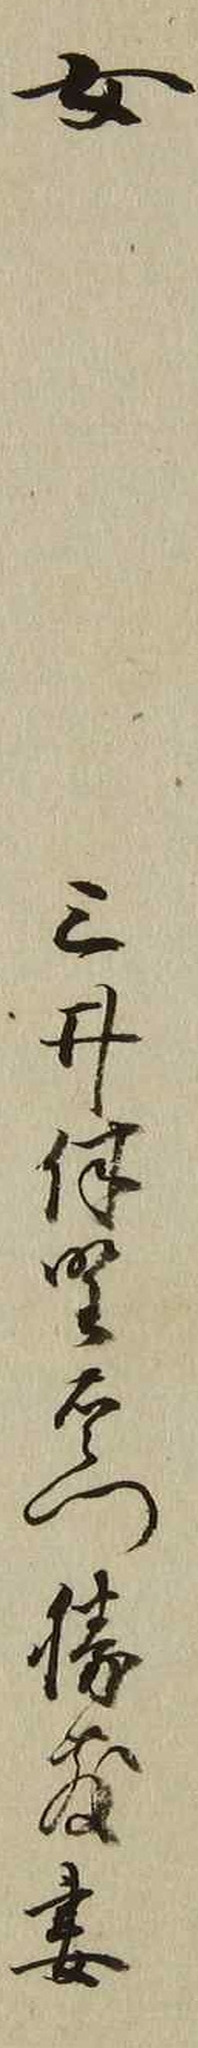女三井伴野右衛門勝敷妻
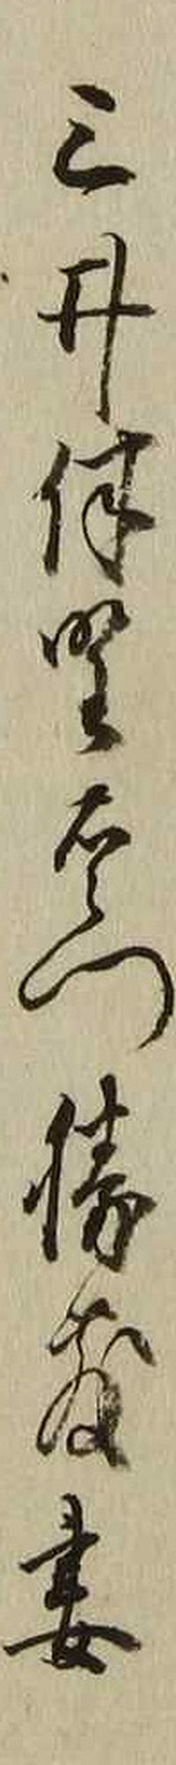女三井伴野右衛門勝敷妻
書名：諸士系譜　巻之1　い之部1
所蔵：会津若松市立会津図書館
